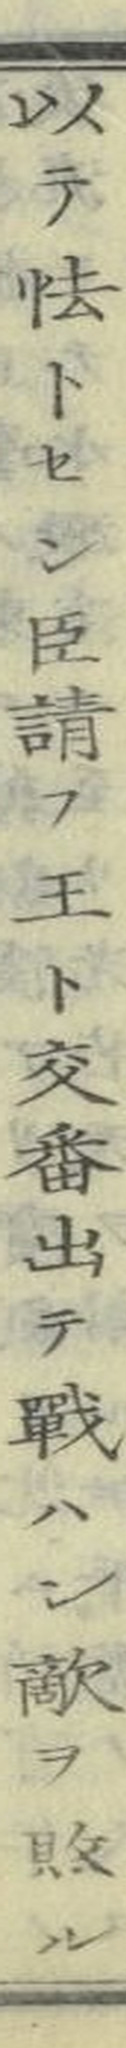以テ怯トセン臣請フ王ト交番出テ戰ハン歒ヲ敗ル
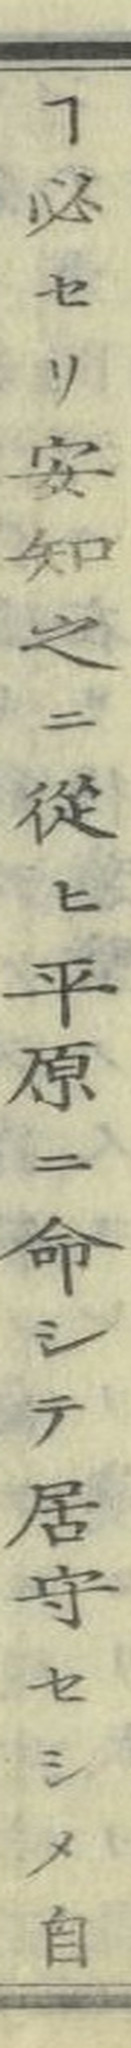コト必セリ安知之ニ從ヒ平原ニ命シテ居守セシメ自
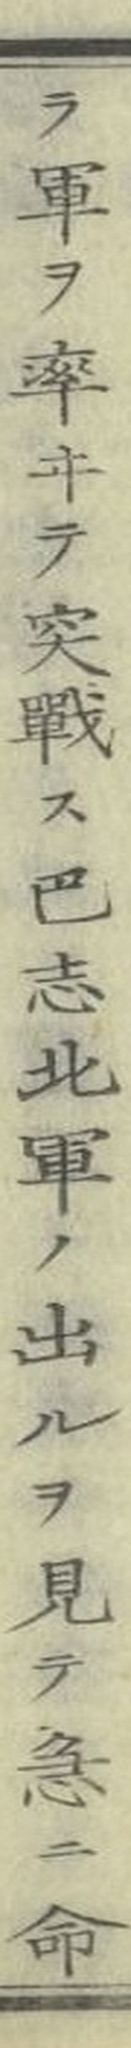ラ軍ヲ率ヰテ突戰ス巴志北軍ノ出ルヲ見テ急ニ命
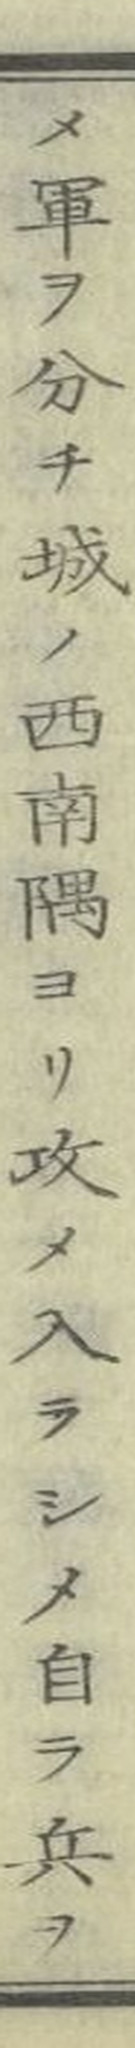シメ軍ヲ分チ城ノ西南隅ヨリ攻メ入ラシメ自ラ兵ヲ
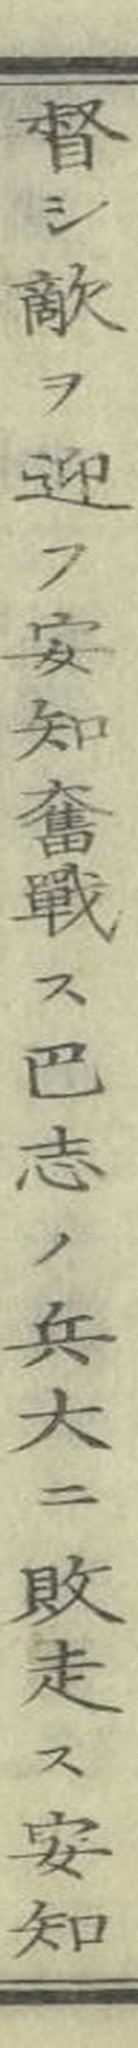督シ歒ヲ迎フ安知奮戰ス巴志ノ兵大ニ敗走ス安知
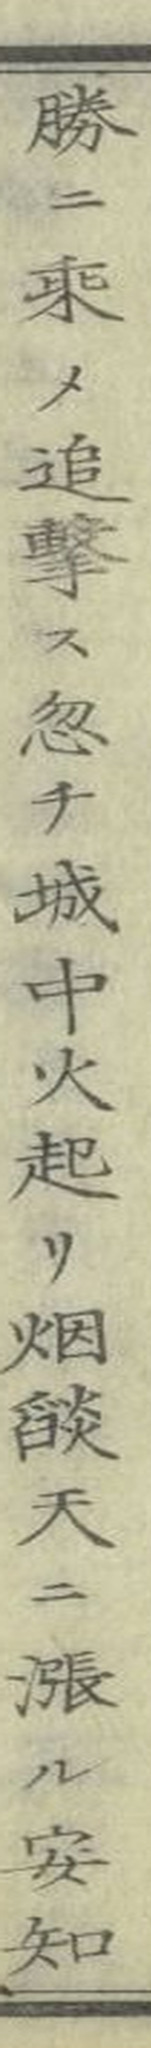勝ニ乘シテ追擊ス忽チ城中火起リ烟天ニ漲ル安知
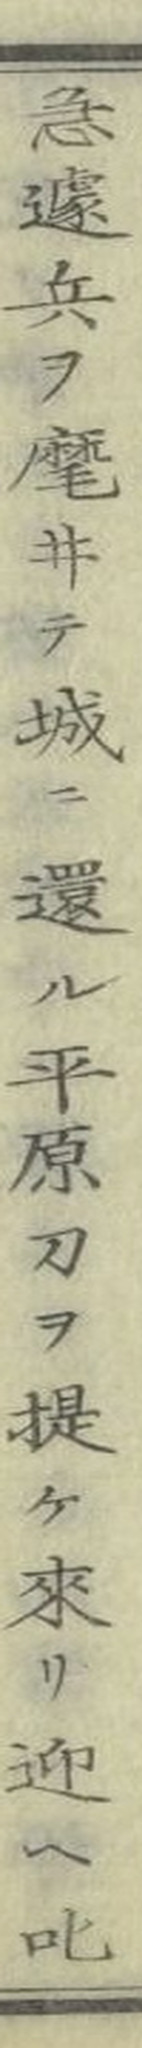急遽兵ヲ麾ヰテ城ニ還ル平原刀ヲ提ケ來リ迎ヘ叱
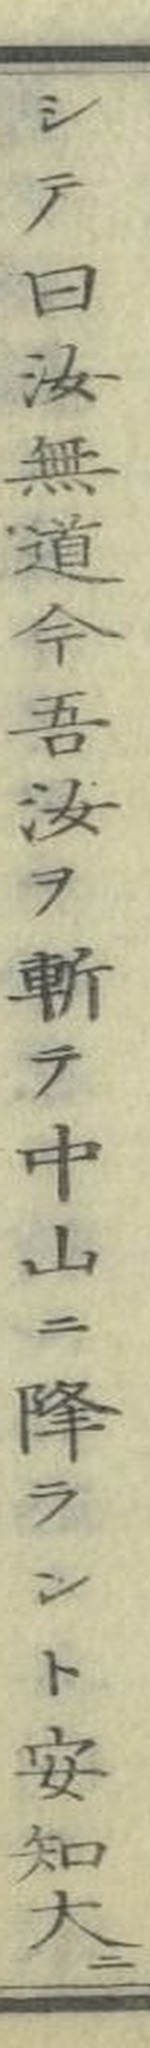シテ曰汝無道今吾汝ヲ斬テ中山ニ降ラント安知大
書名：琉球藩史 一之巻
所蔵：University of the Ryukyus Library
